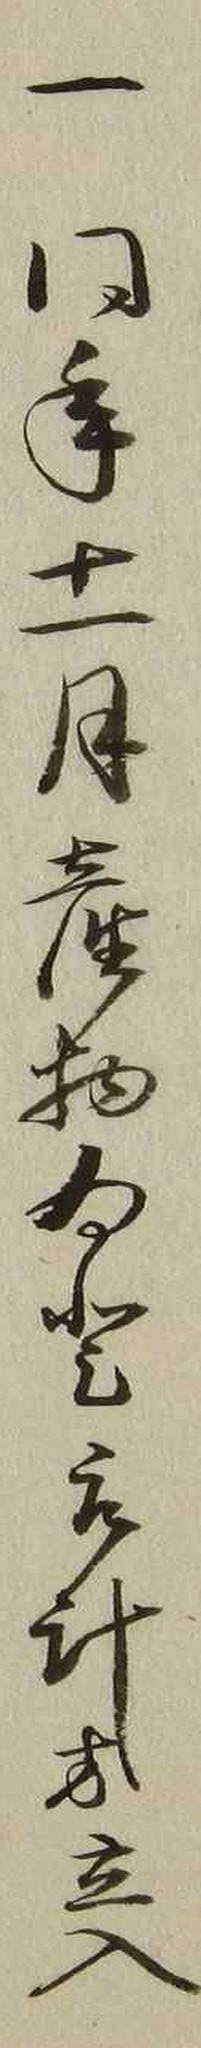一同年十一月産物為登取計方立入
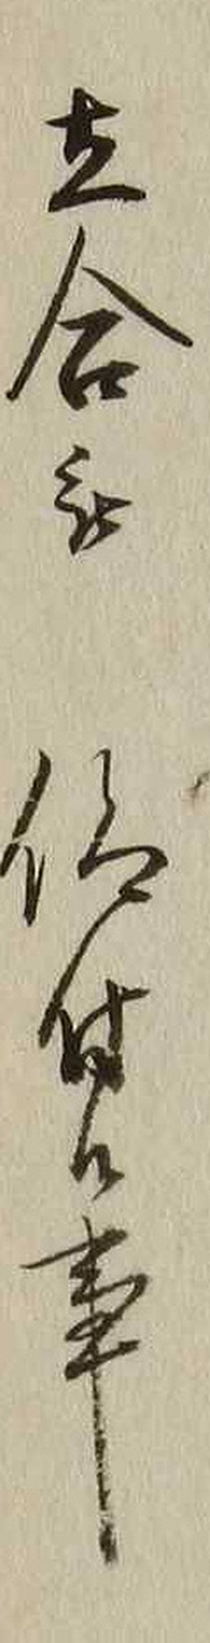立合被仰付候事
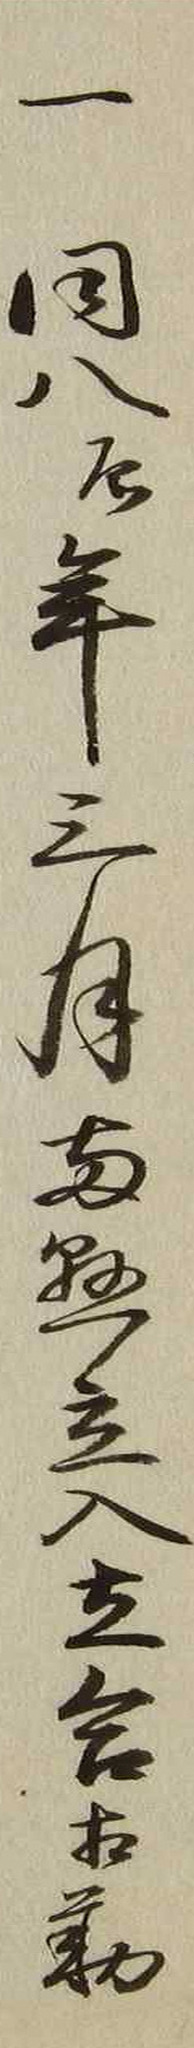一同八辰年三月両懸立入立合相勤
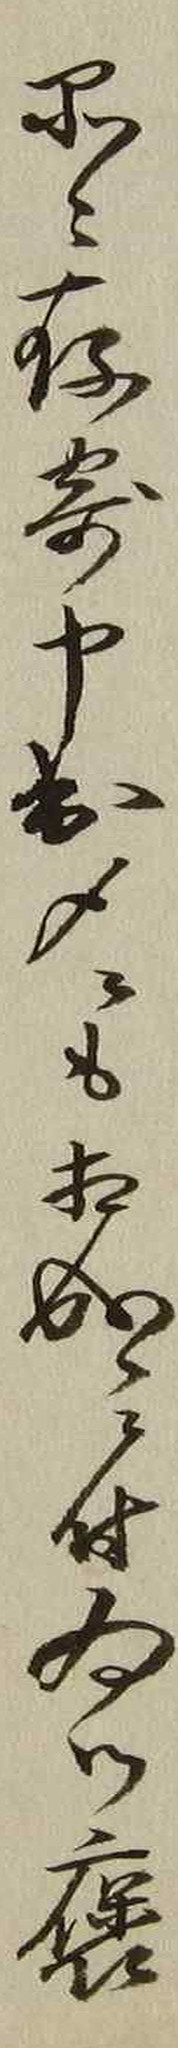品々存寄申出〆ニも相成候ニ付為御褒
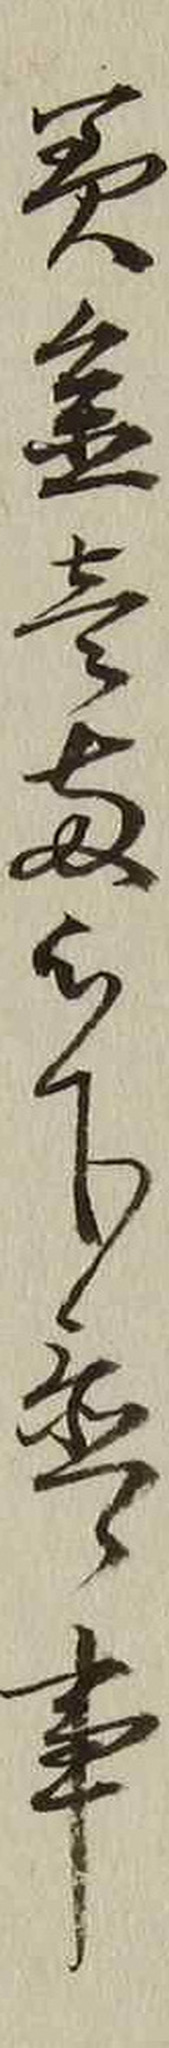美金壱両被下置候事
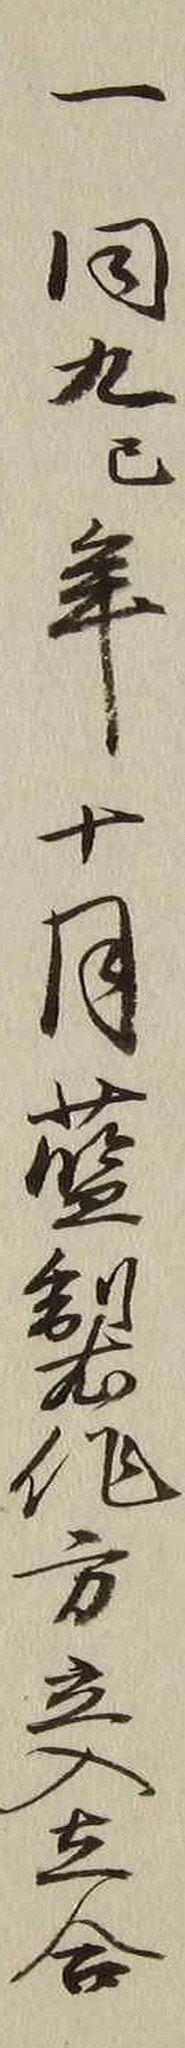一同九巳年十月藍製作方立入立合
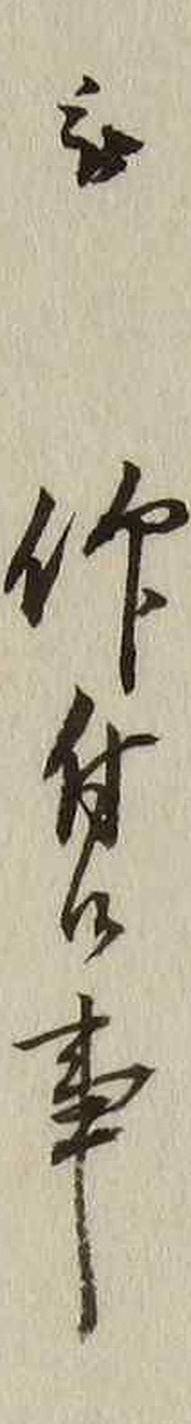被仰付候事
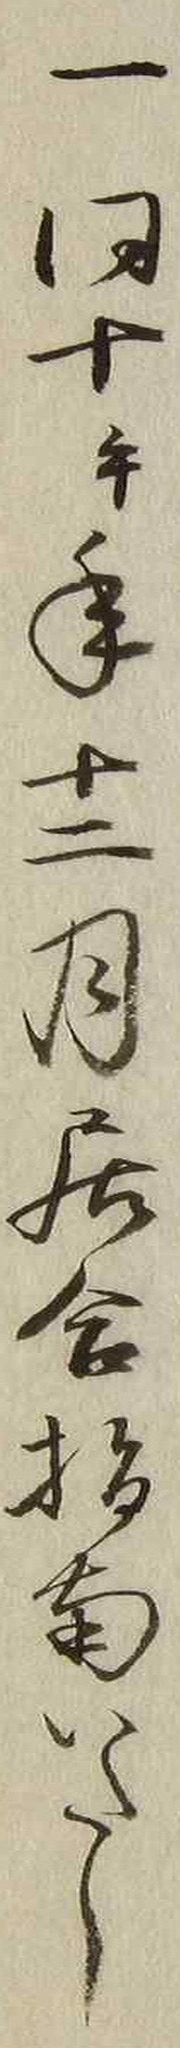一同十午年十二月居合指南いたし
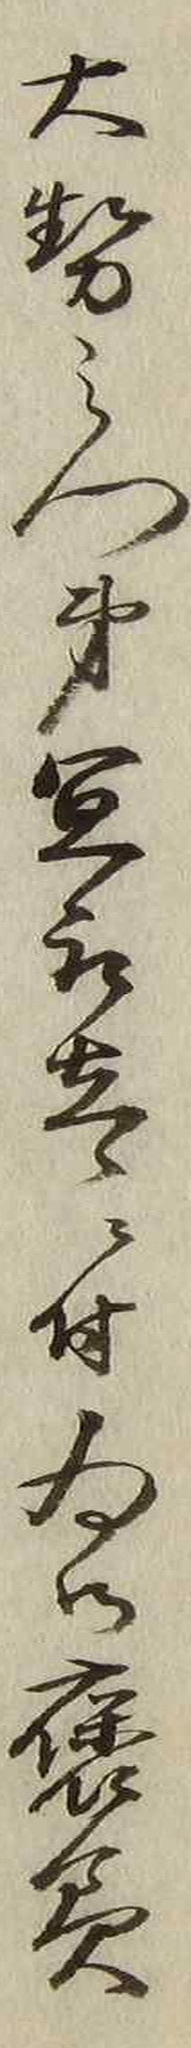大勢之門弟宜取立候ニ付為御褒美
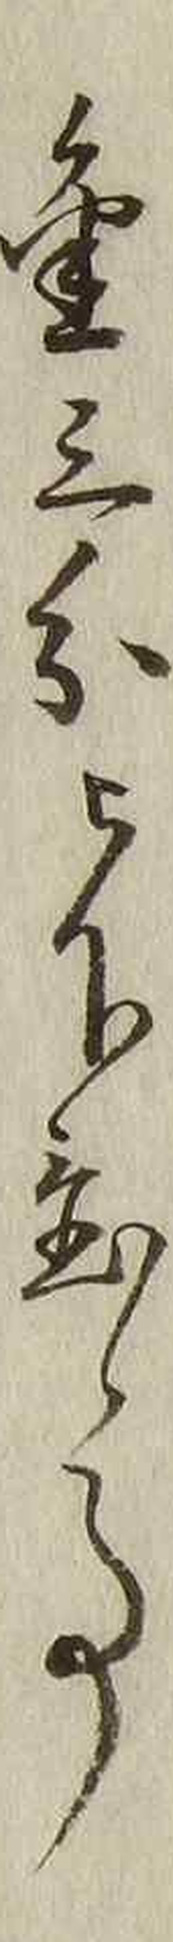金三分被下置候事
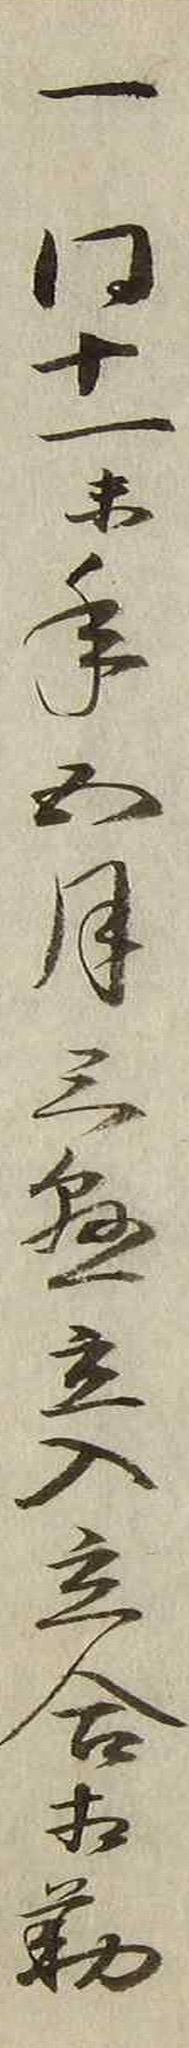一同十一未年五月三懸立入立合相勤
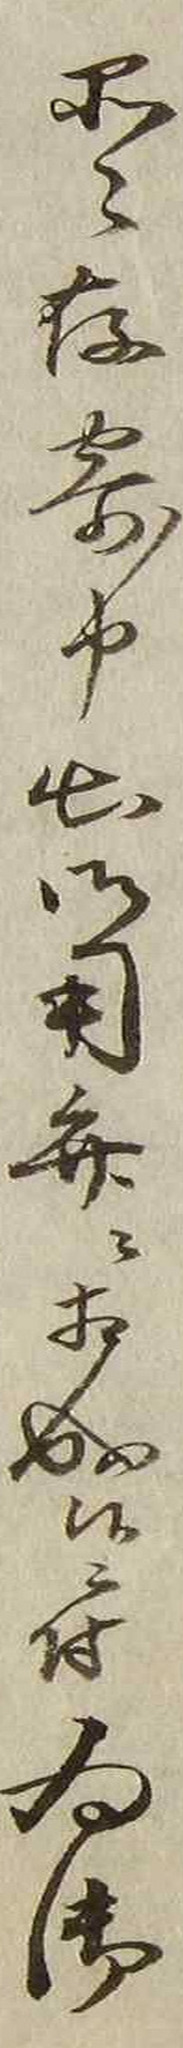品々存寄申出御用弁ニ相成候ニ付為御
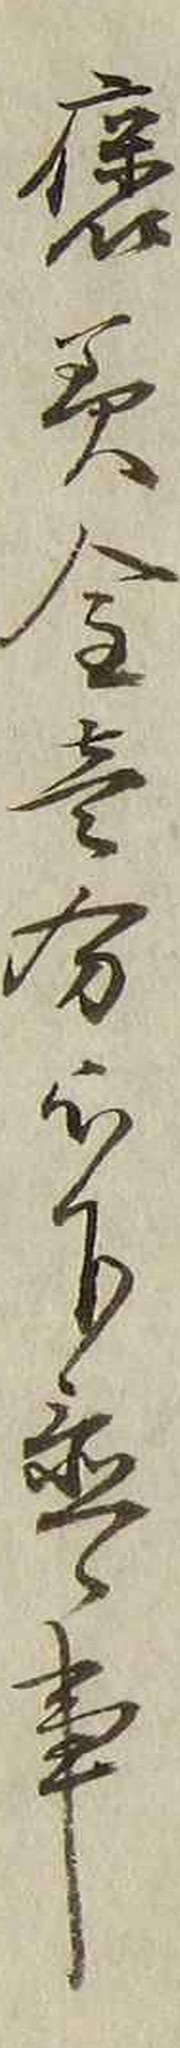褒美金壱分被下置候事
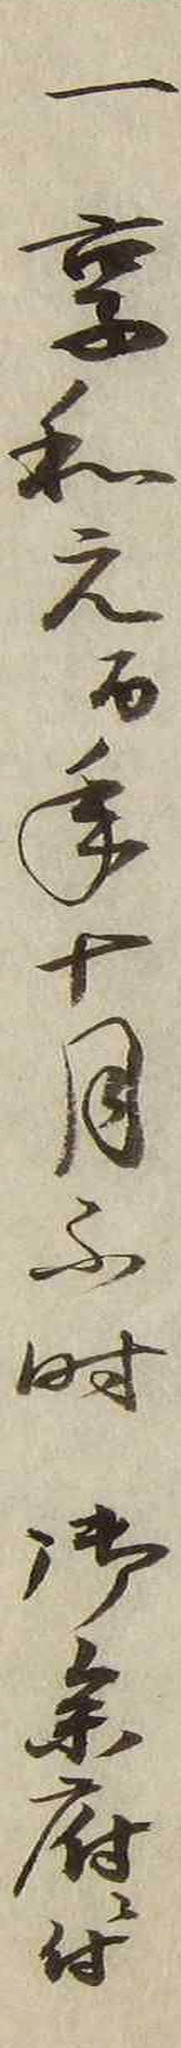一享和元酉年十月不時御参府ニ付

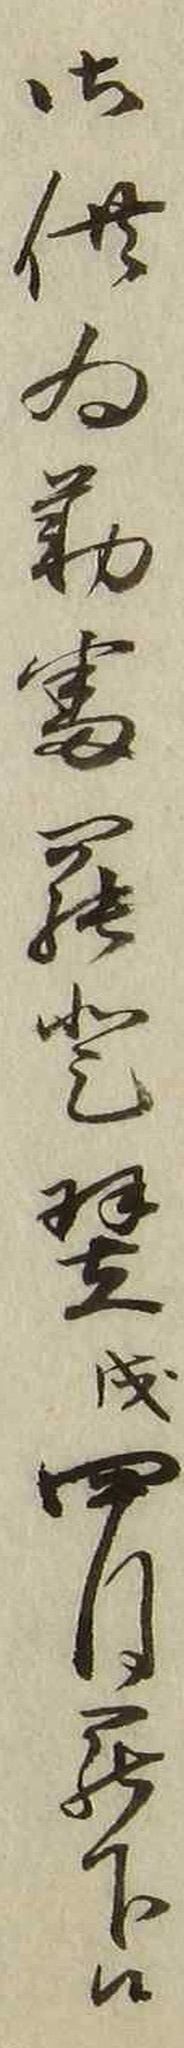御供為勤番罷登翌戌四月罷下候
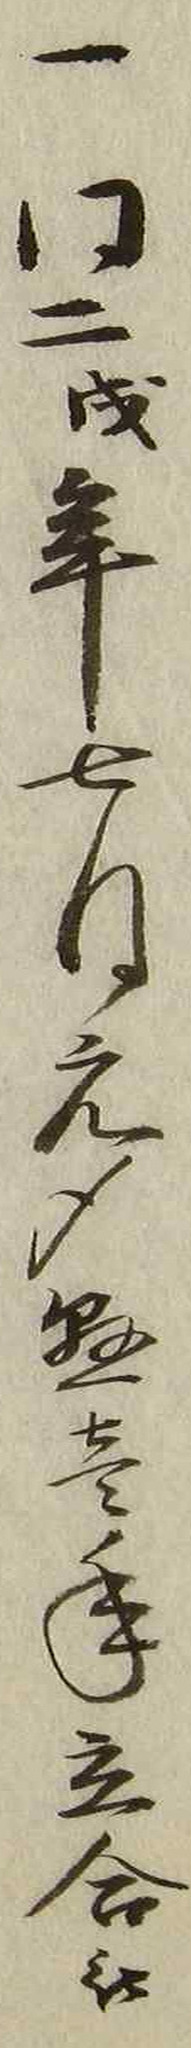一同二戌年七月元〆懸壱年立合被
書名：諸士系譜　巻之102　か之部10
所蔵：会津若松市立会津図書館
